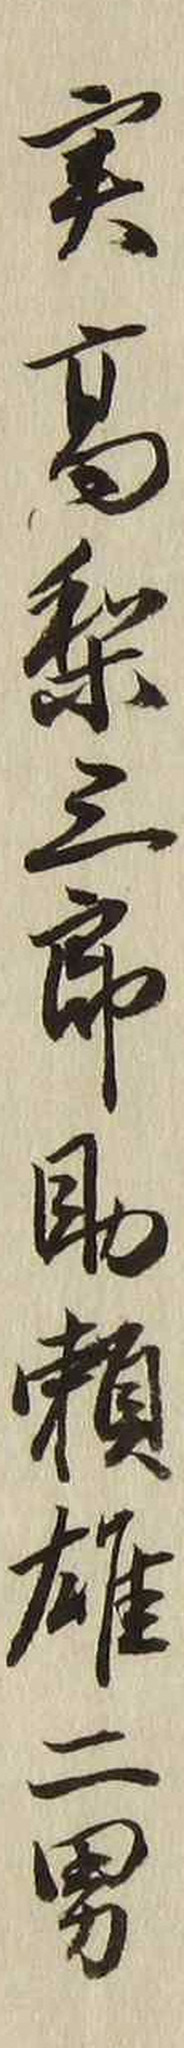実高梨三郎助頼雄二男
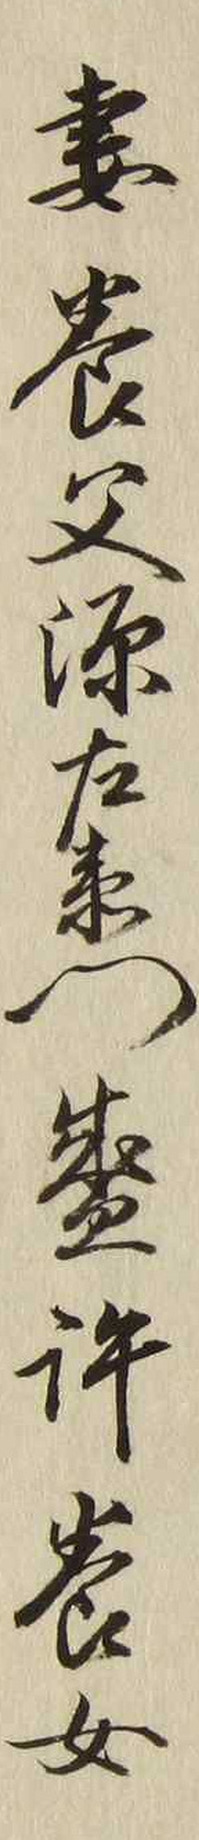妻養父源左衛門盛許養女

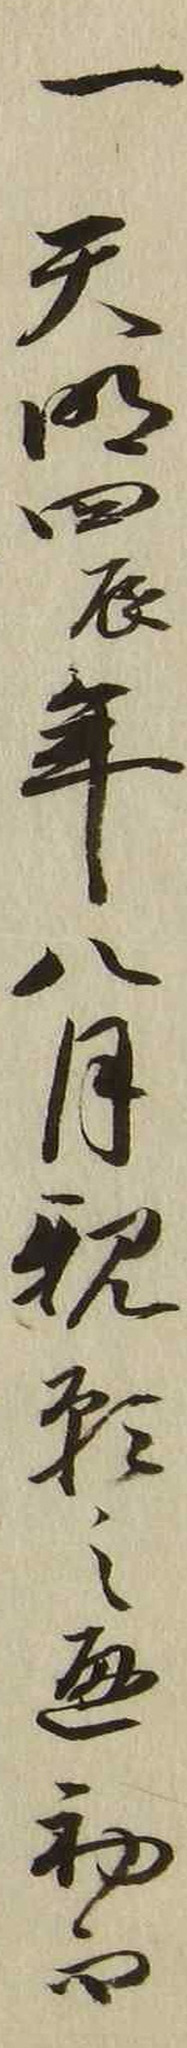一天明四辰年八月親願之通初而
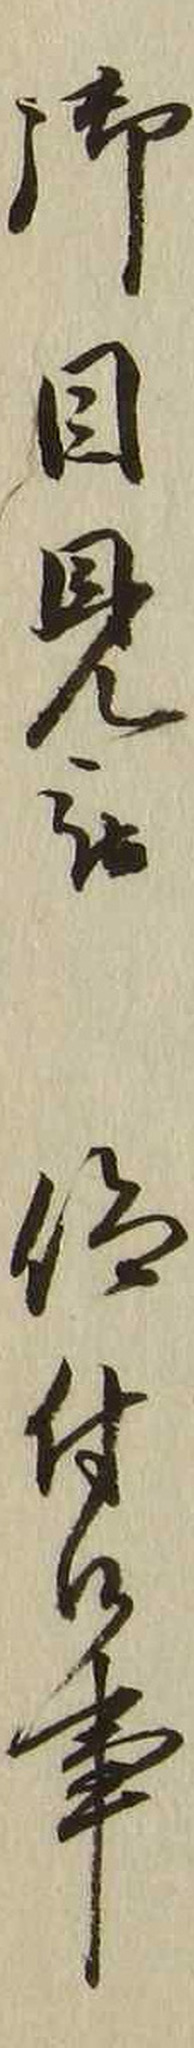之御目見被仰付候事
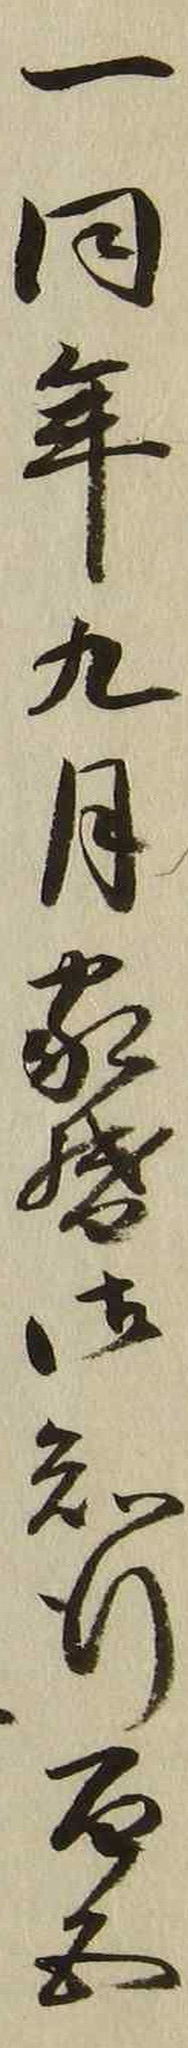一同年九月家督御知行百五
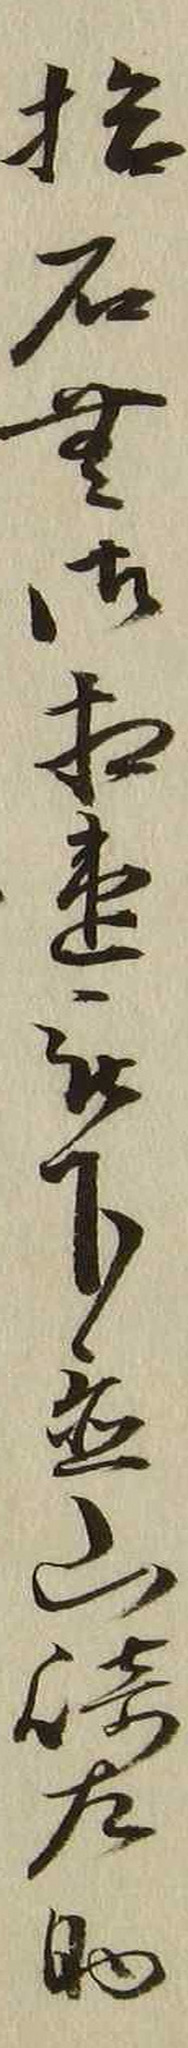拾石無御相違被下置山崎左助
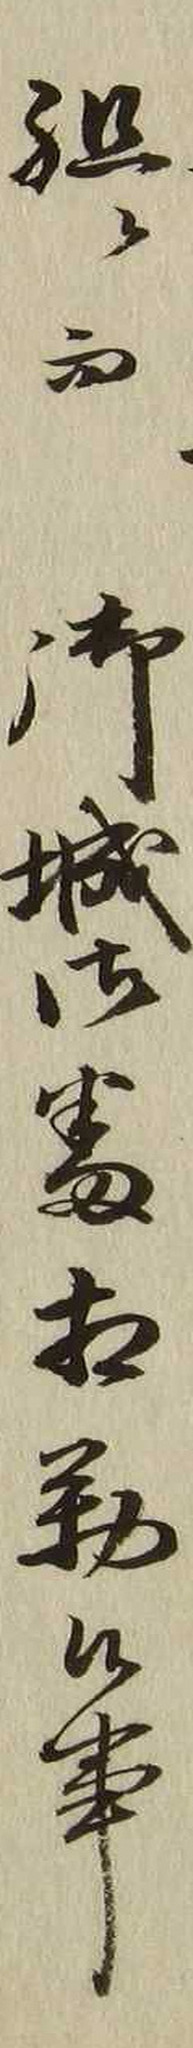組ニ而御城御番相勤候事
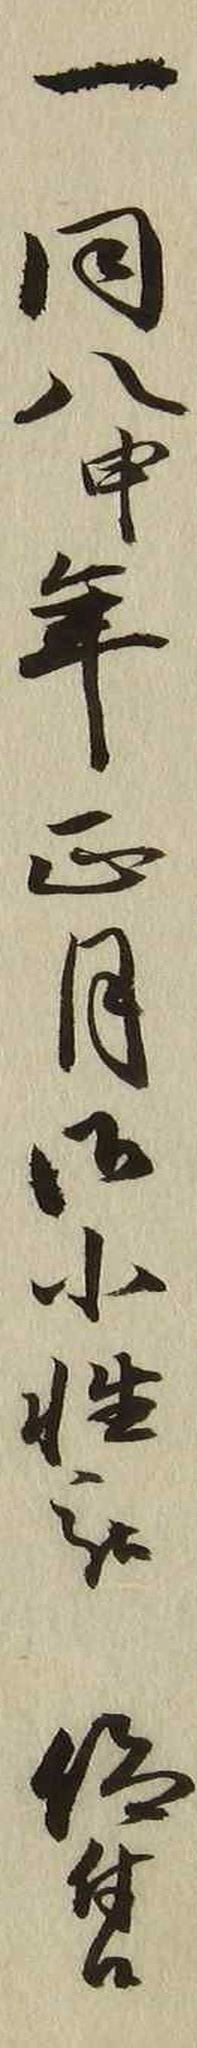一同八申年正月御小性被仰付候
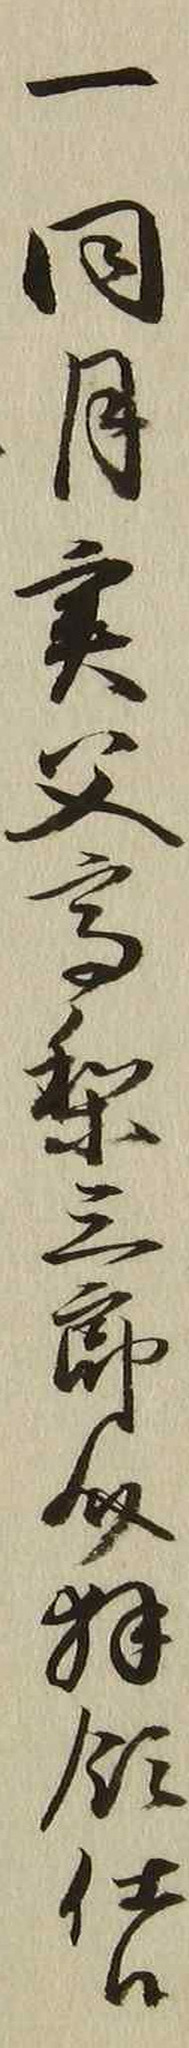一同月実父高梨三郎介拝領仕候
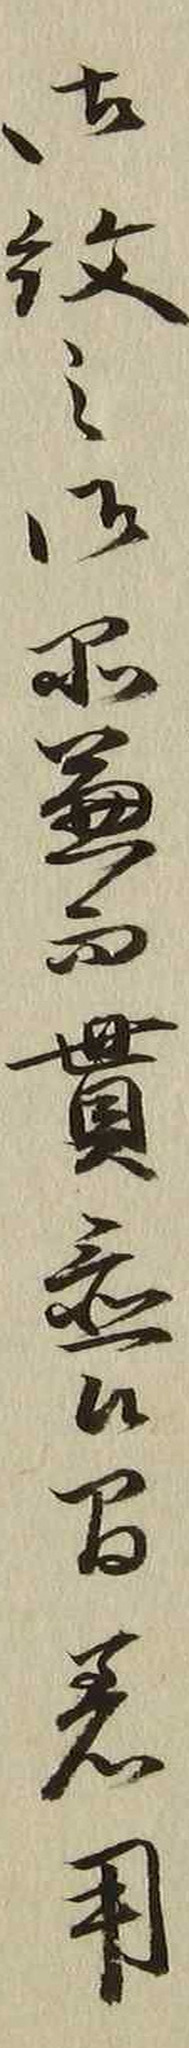御紋之御品兼而貰置候間着用
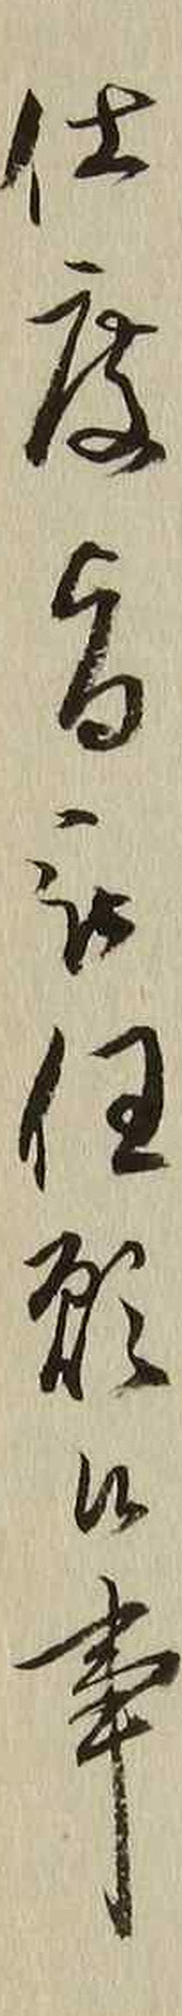仕度旨被任願候事
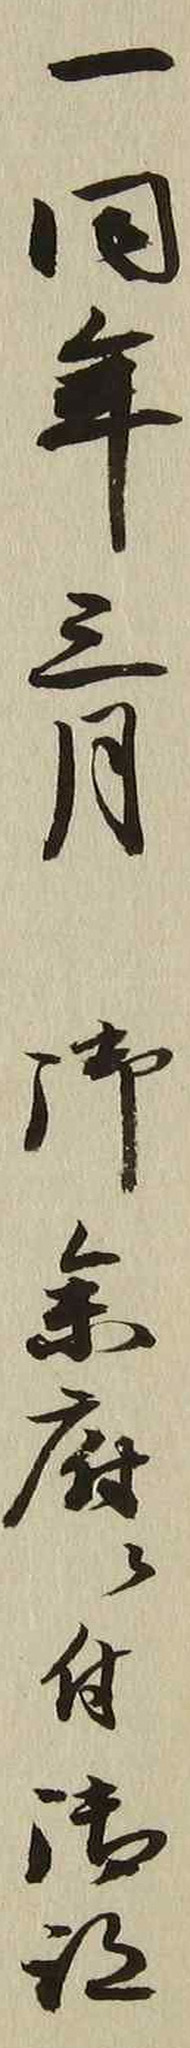一同年三月御参府ニ付御跡
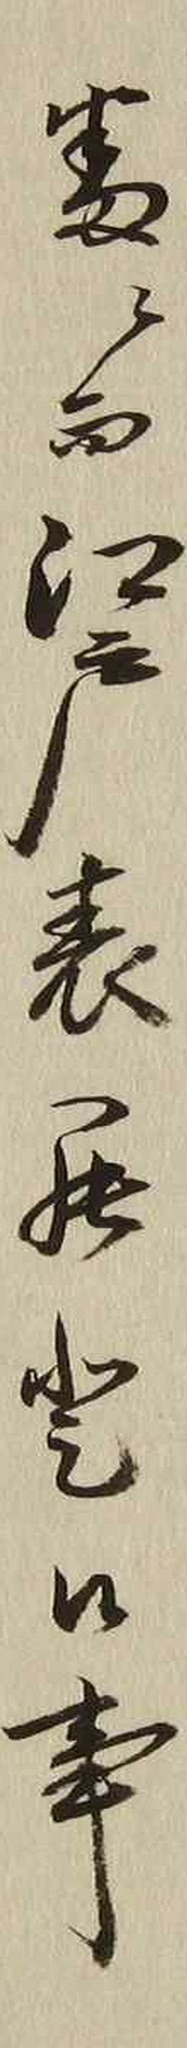番ニ而江戸表罷登候事
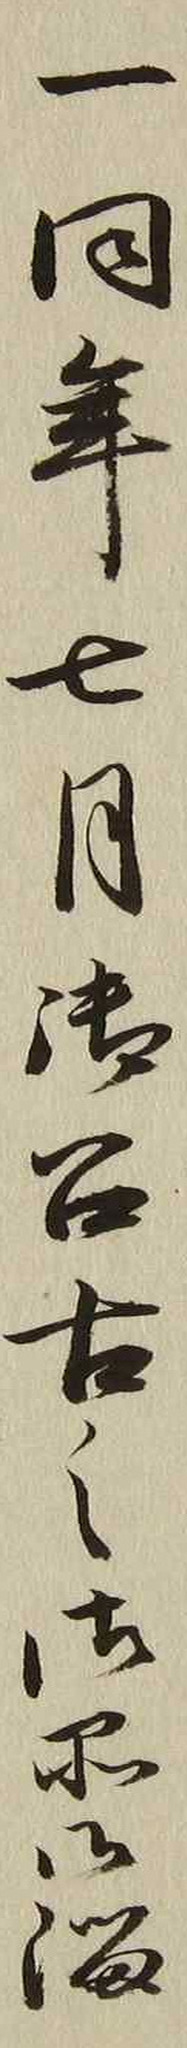一同年七月御召古之御品御酒
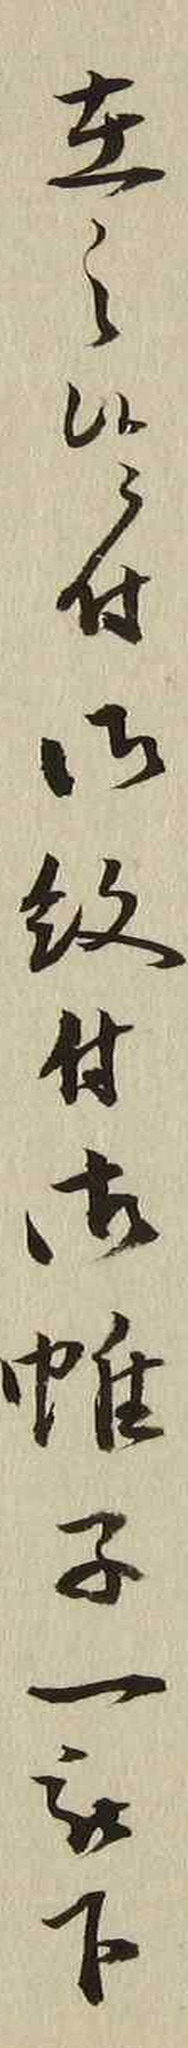在之候ニ付御紋付御帷子一被下
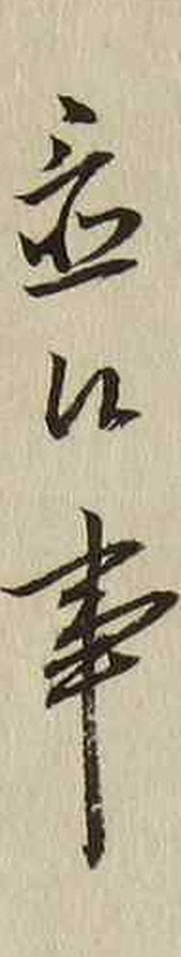置候事
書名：諸士系譜　巻之61　と之部4
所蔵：会津若松市立会津図書館
